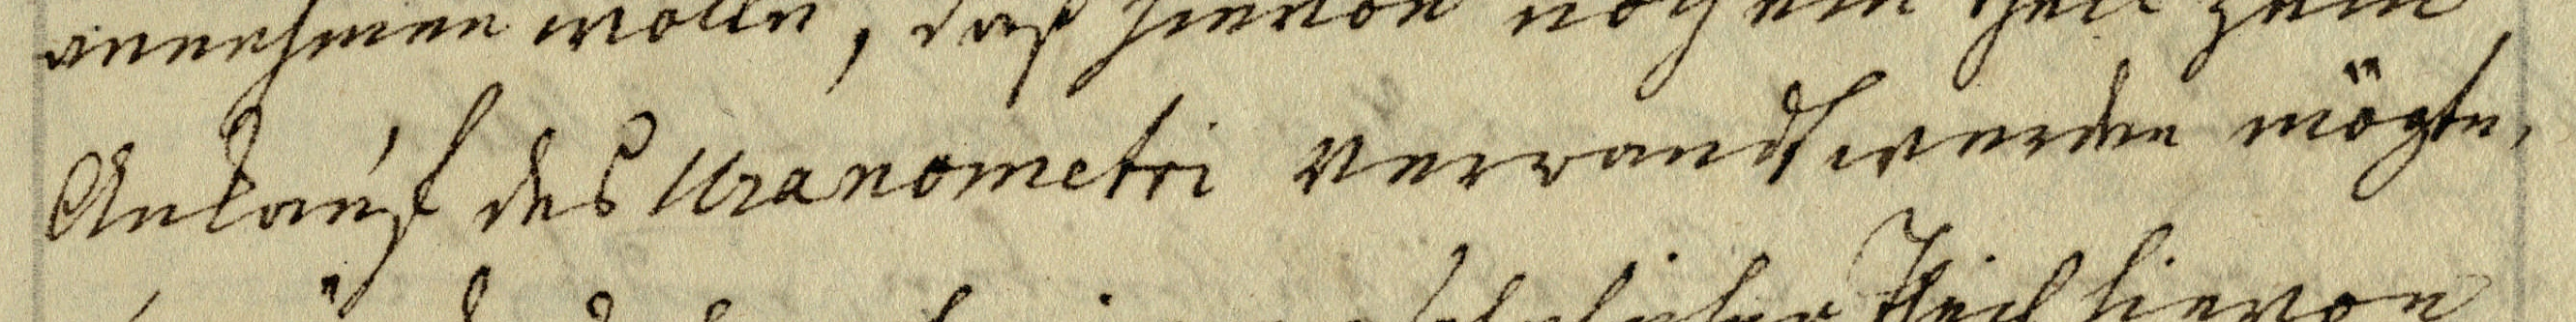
Ankauf des Uranometri verwandt werden mögte,
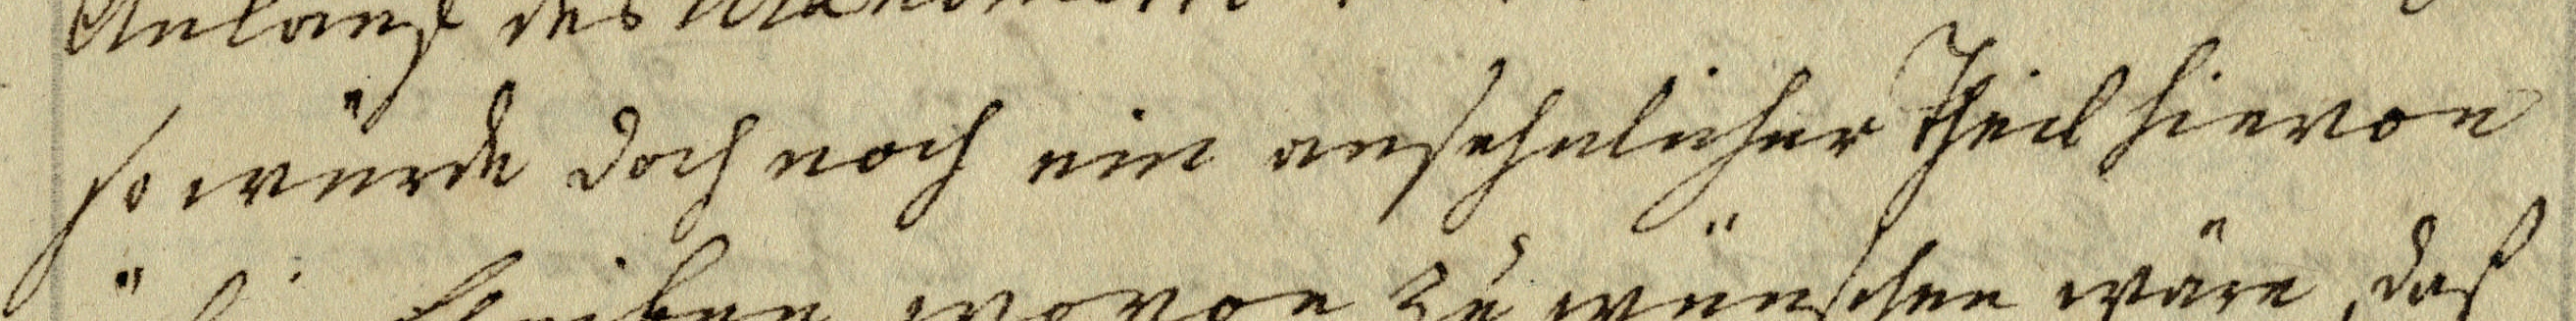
so würde doch noch ein ansehnlicher Theil hievon
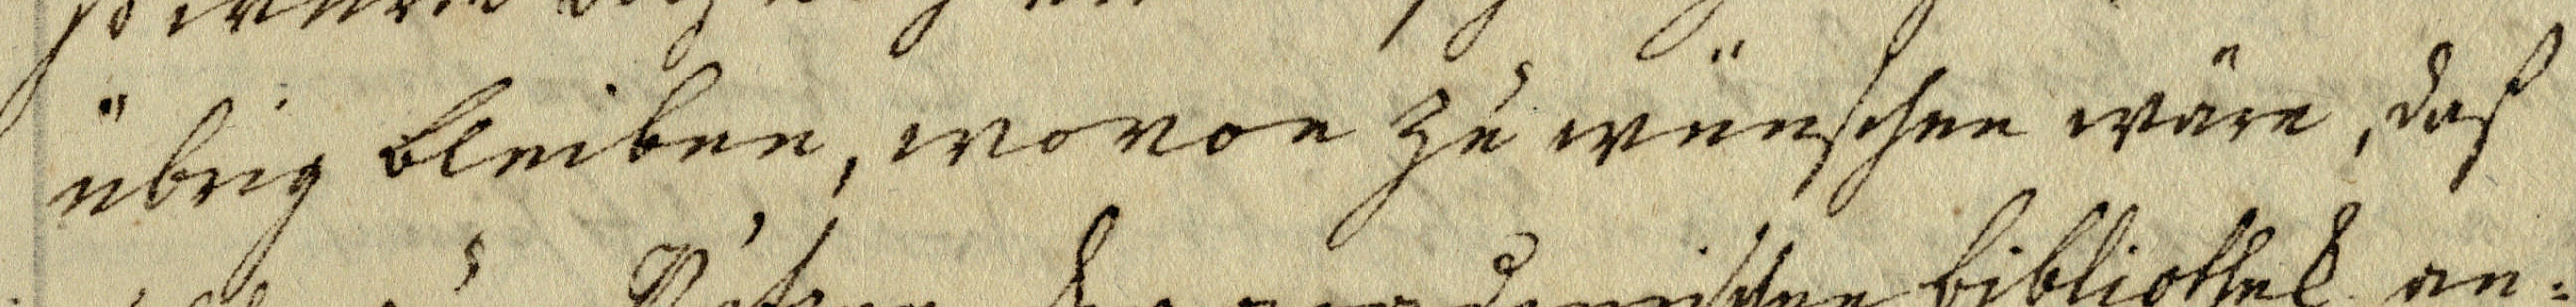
übrig bleiben, wovon zu wünschen wäre, daß
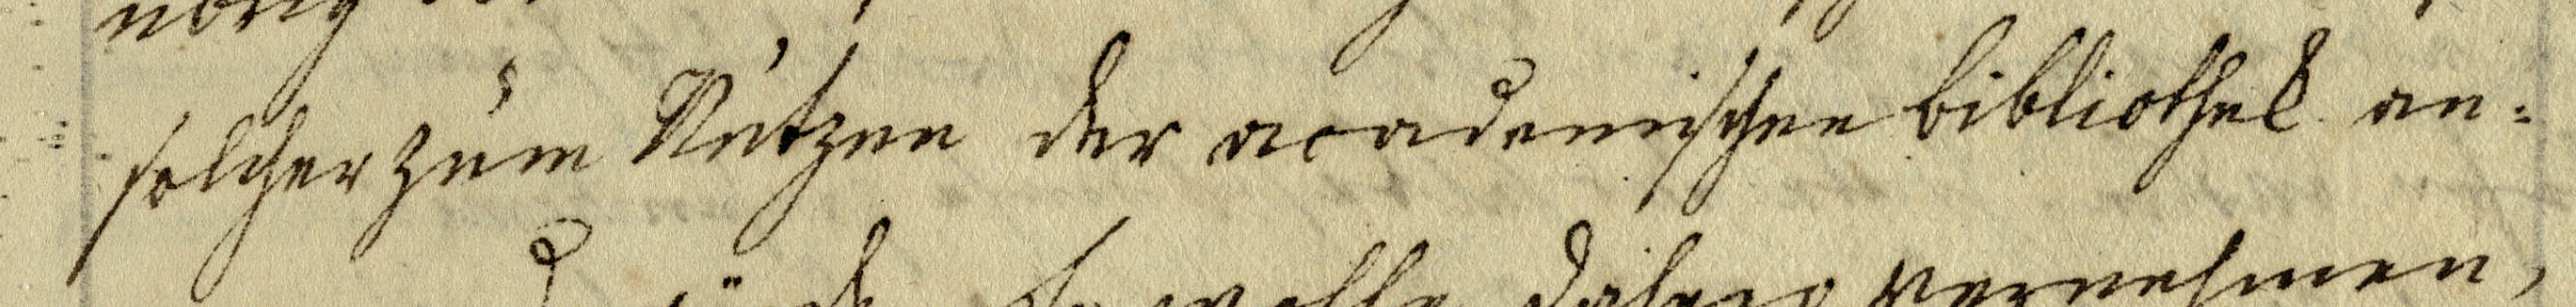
solcher zum Nutzen der academischen Bibliothek an¬
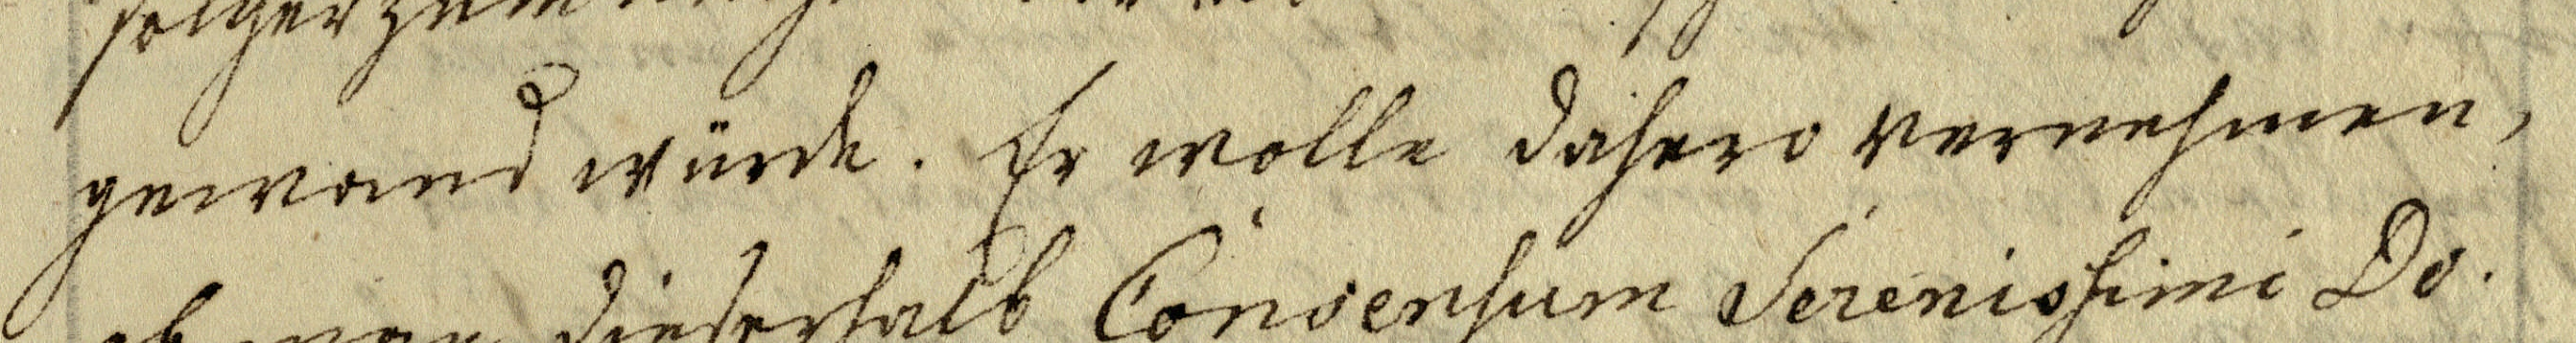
gewand würde. Er wolle dahero vernehmen,
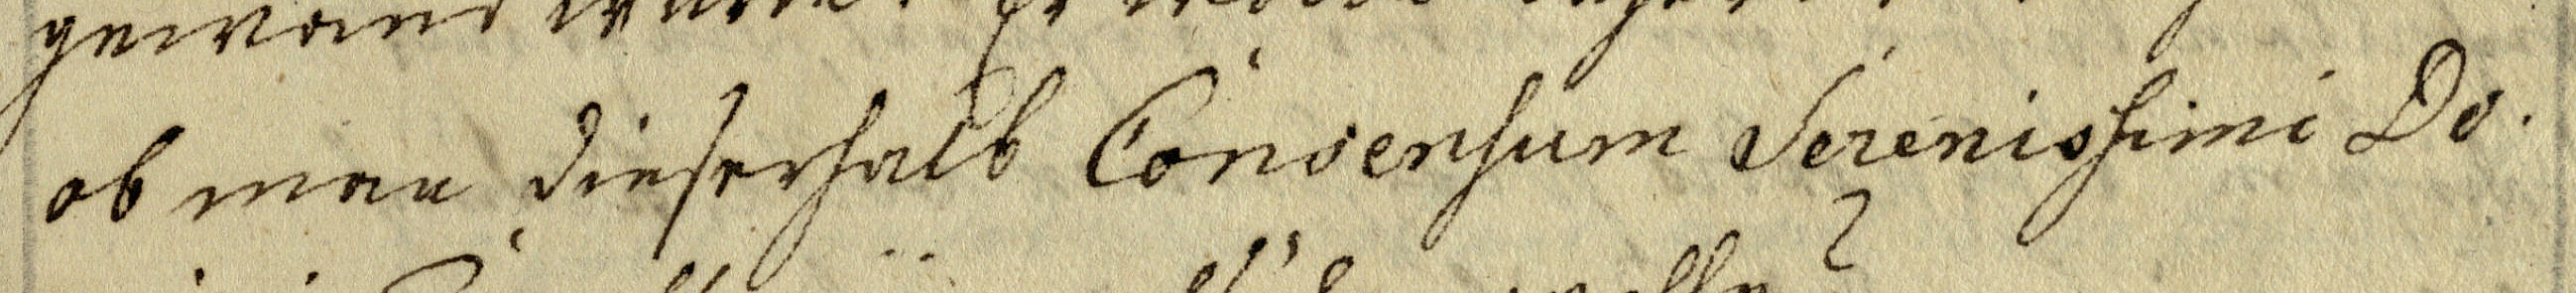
ob man dieserhalb Consensum Serenissimi Do¬
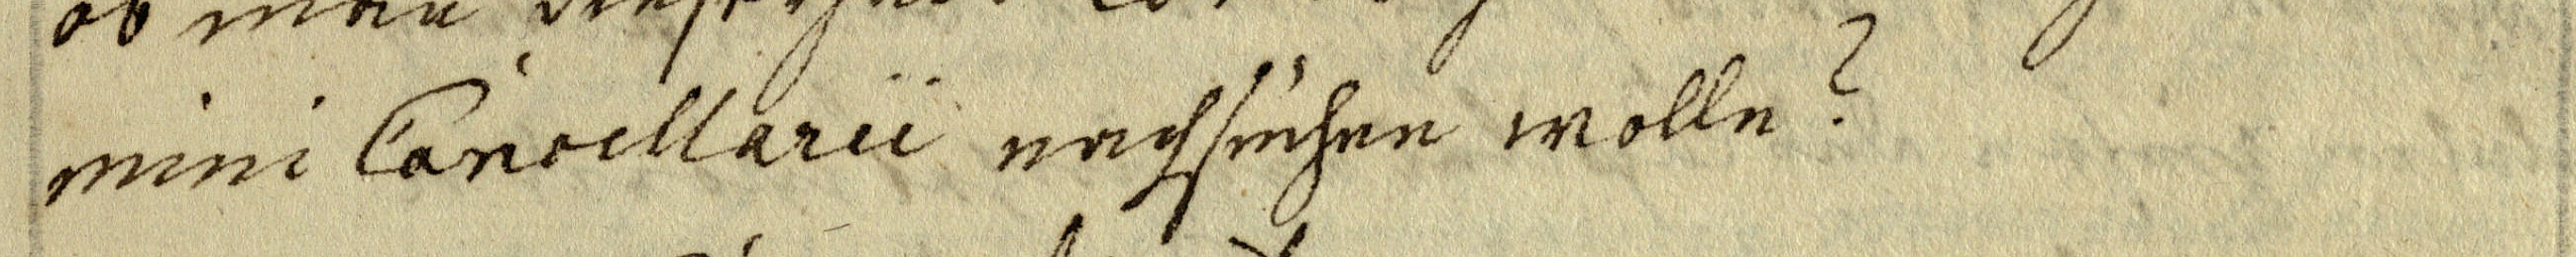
mini Cancellarii nachsuchen wolle?
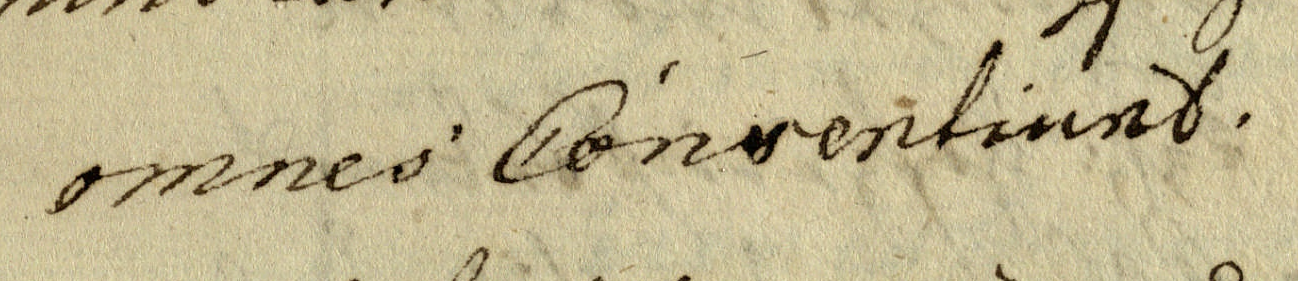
omnes Consentiunt.
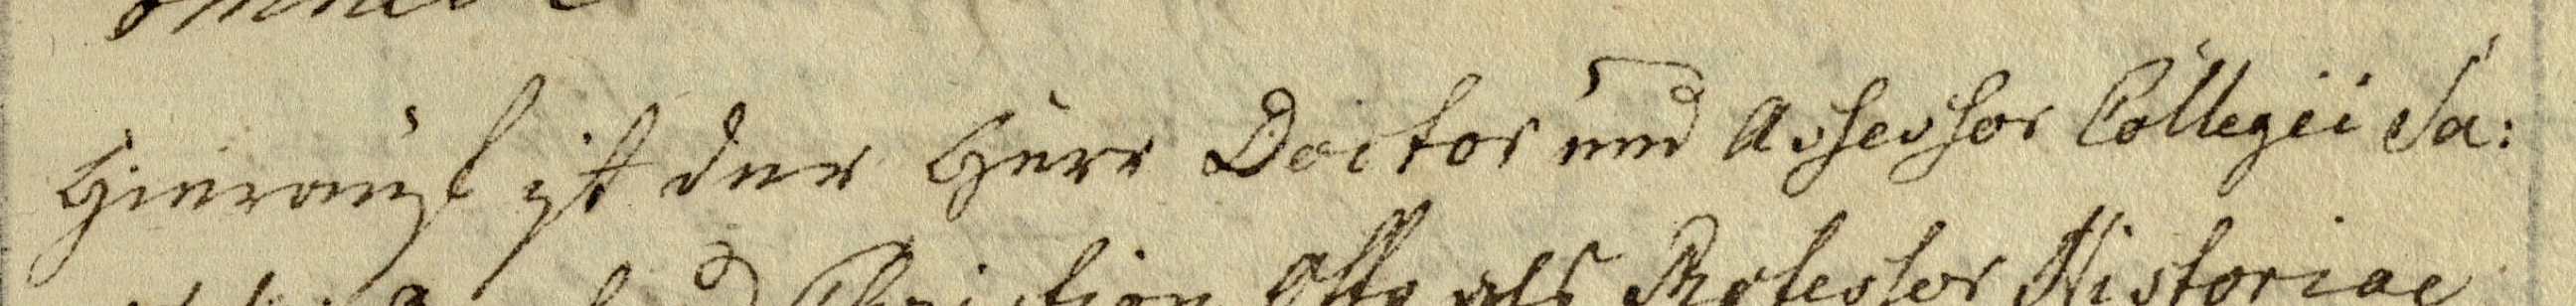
Hierauf ist der Herr Doctor und Assessor Collegii Sa¬
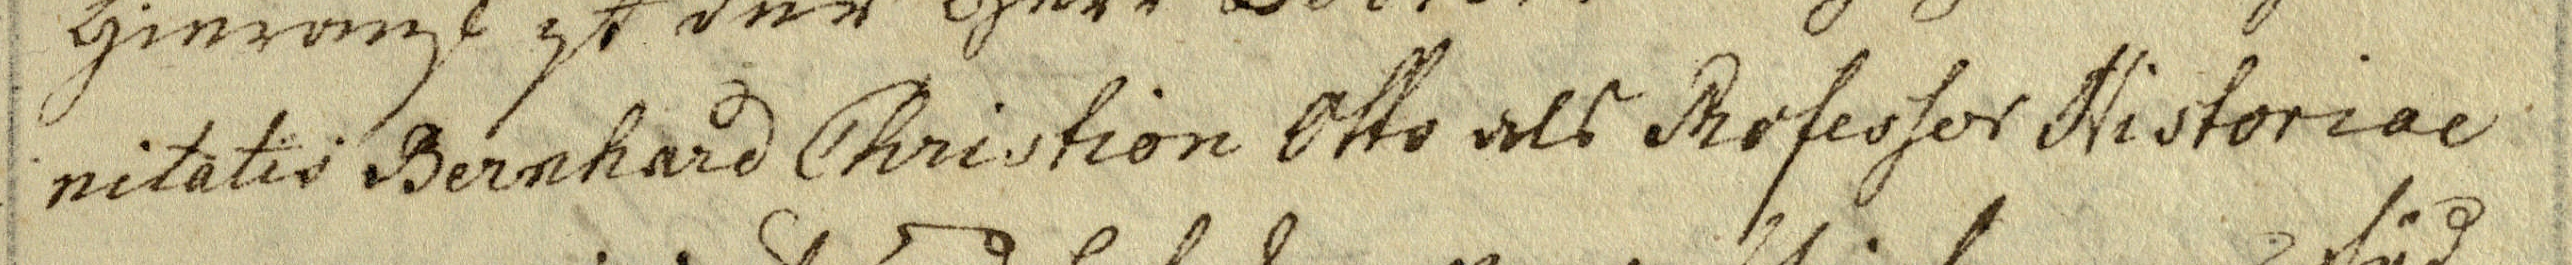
nitatis Bernhard Christian Otto als Professor Historiae
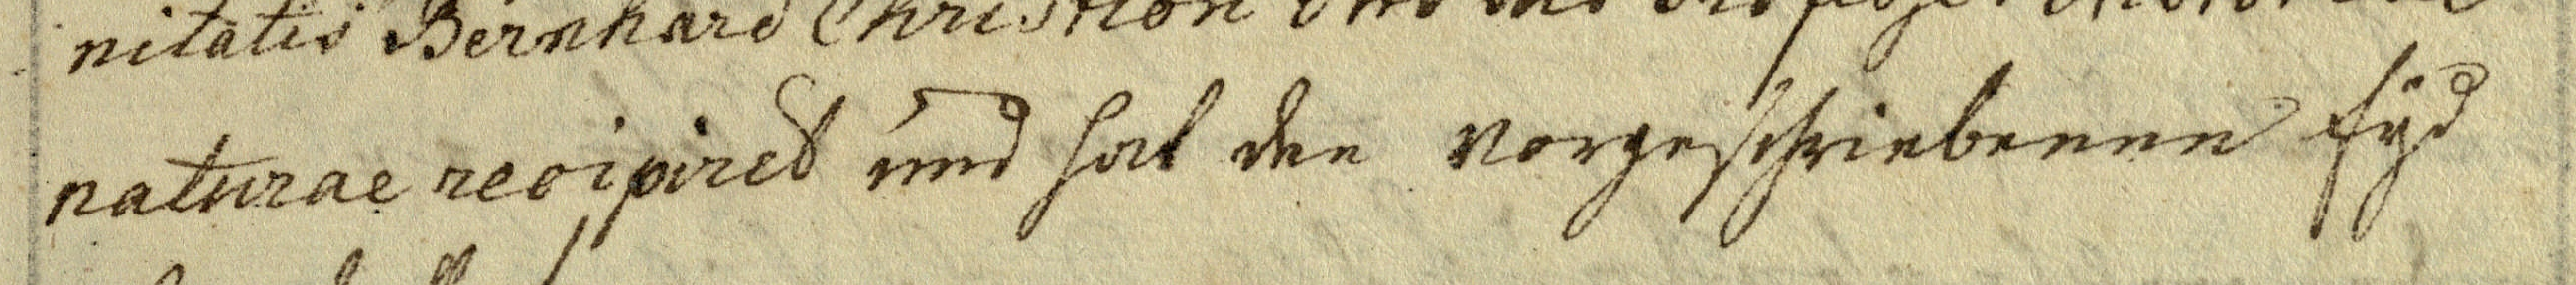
naturae recipiret und hat den vorgeschriebenen Eÿd
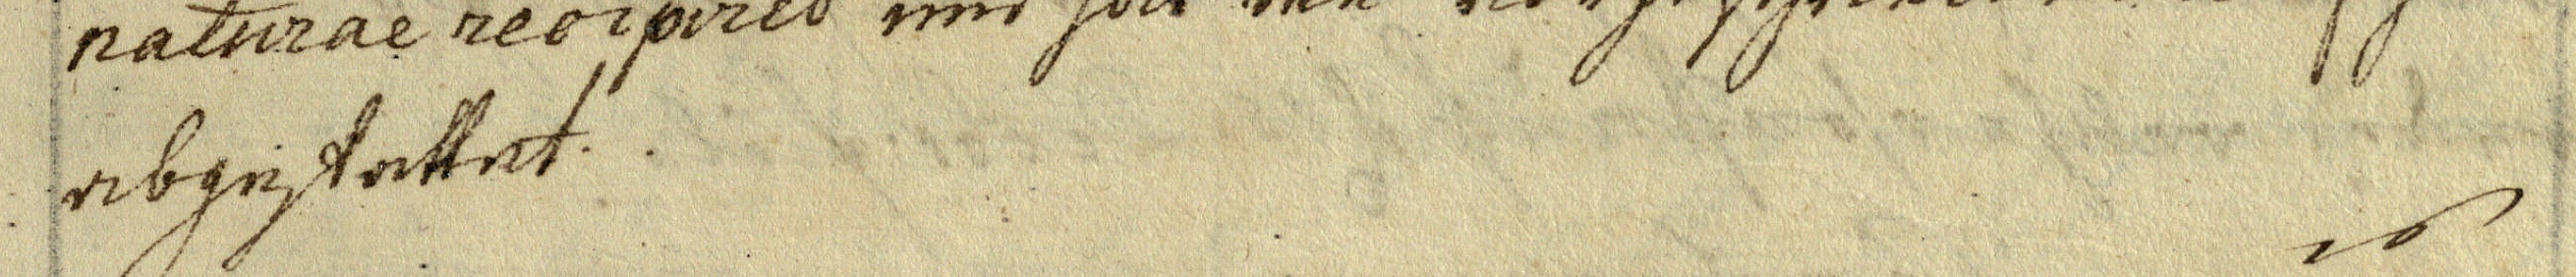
abgestattet.
